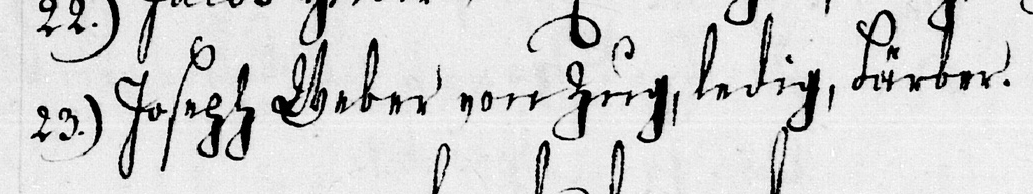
23.) Joseph Weber von Zug, ledig, Färber.
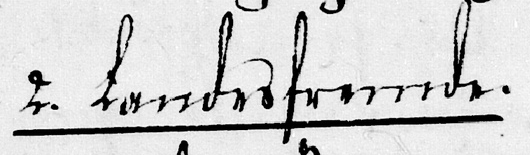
2. Landesfremde.
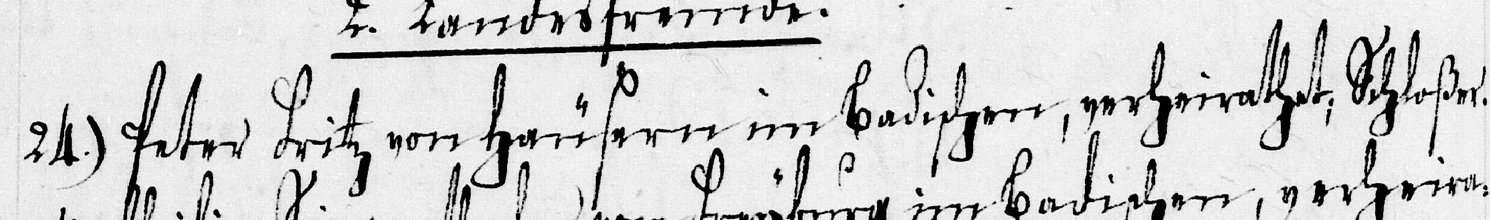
24.) Peter Fritz von Häusern im Badischen, verheirathet,
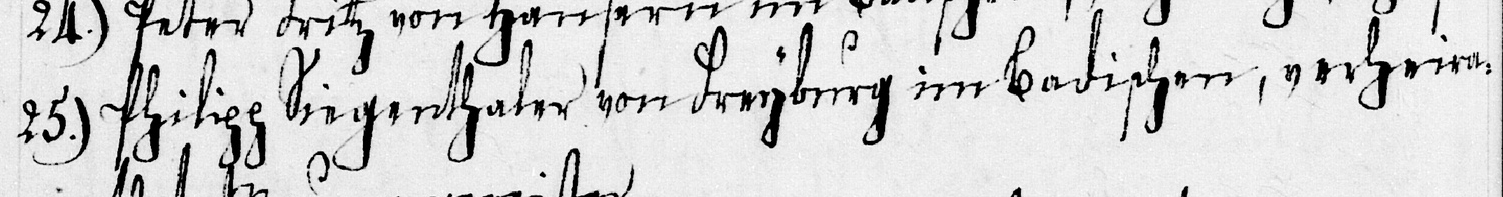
25.) Philipp Siegenthaler von Freyburg im Badischen, verheira¬
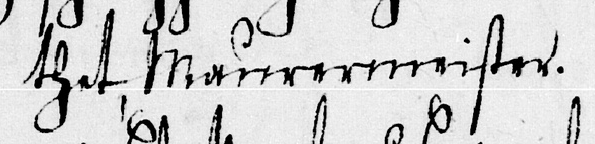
thet, Maurermeister.
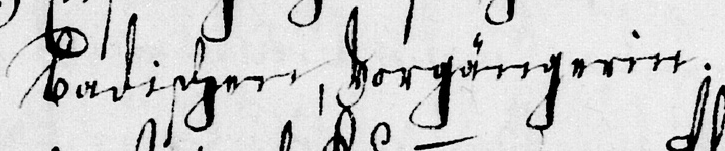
Badischen, Vorgängerin.
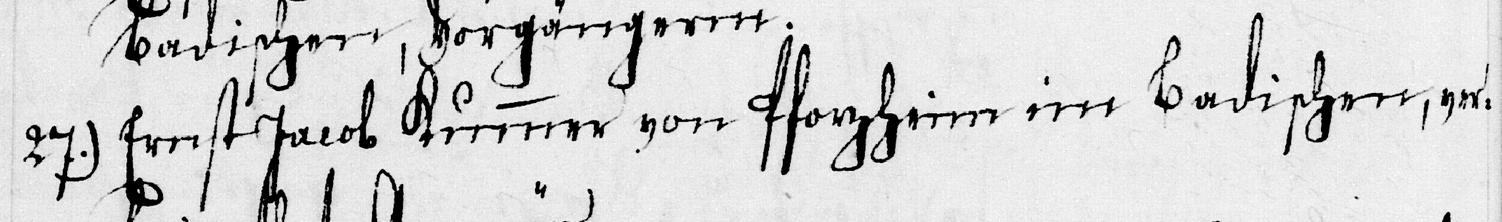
27.) Ernst Jacob Kummer von Pforzheim im Badischen, ver¬
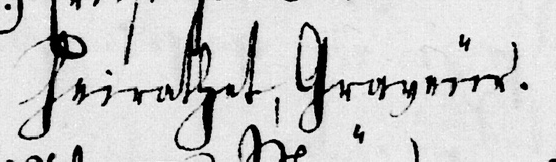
heirathet, Graveur.
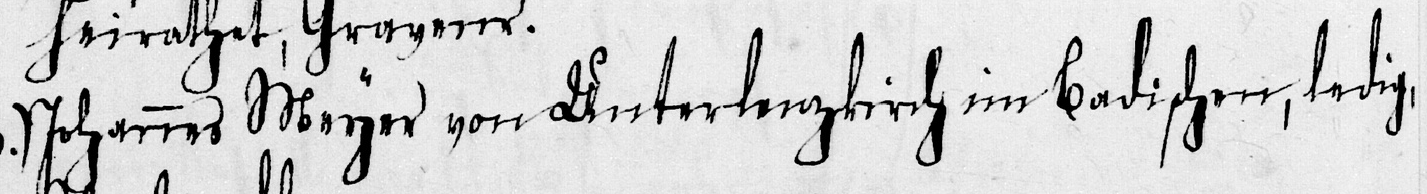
Johannes Meyer von Unterlenzkirch im Badischen, ledig,
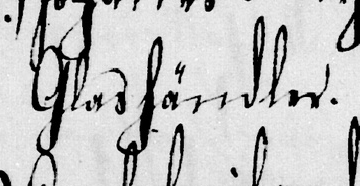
Glashändler.
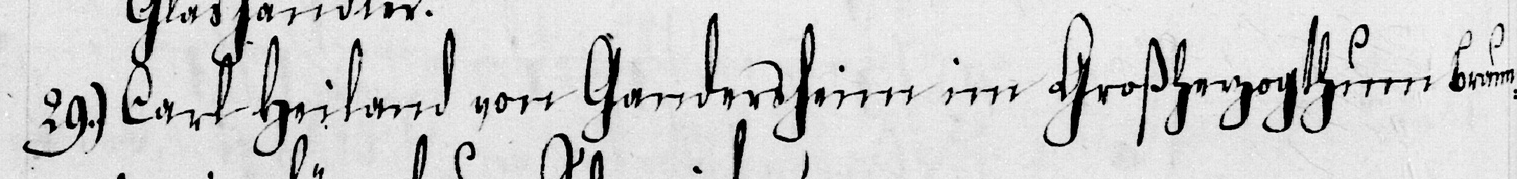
29.) Carl Heiland von Gandersheim im Großherzogthum Br¬
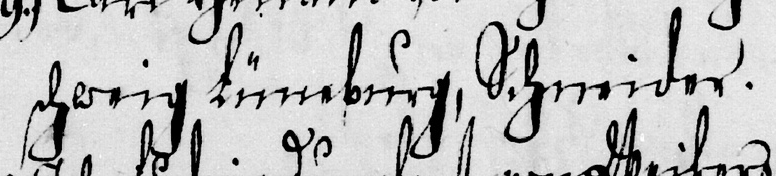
schweig Lüneburg, Schneider.
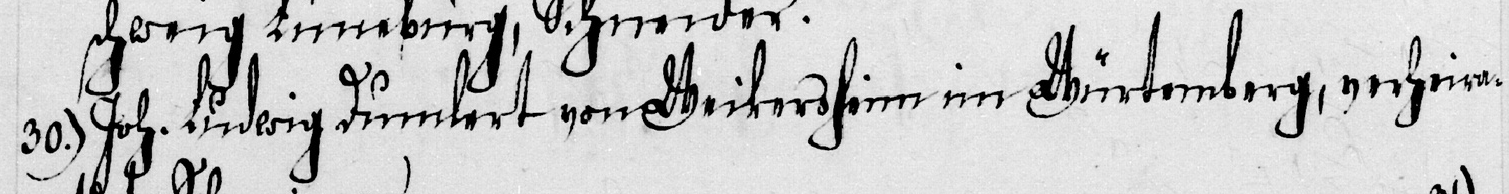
30.) Joh. Ludwig Dumlert von Weikersheim im Würtemberg, verheira¬
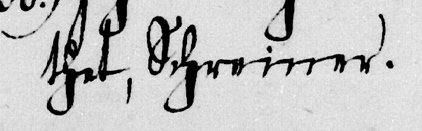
thet, Schreiner.
